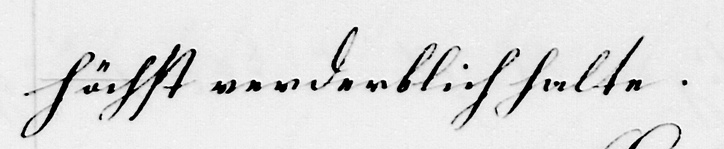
höchst verderblich halte.
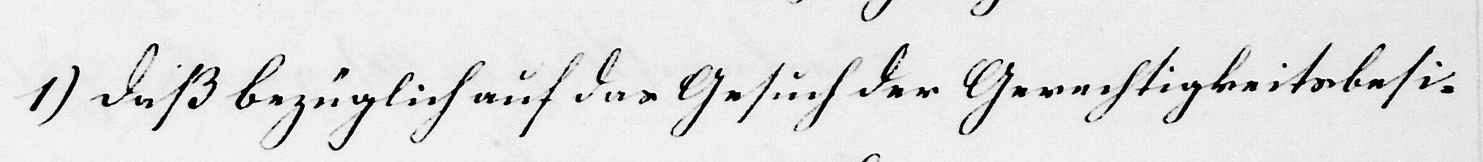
1) Daß bezüglich auf das Gesuch der Gerechtigkeitsbesi¬
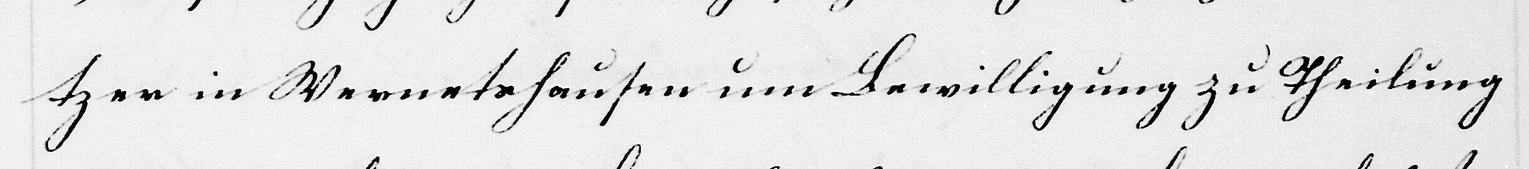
tzer in Wernetshausen um Bewilligung zu Theilung
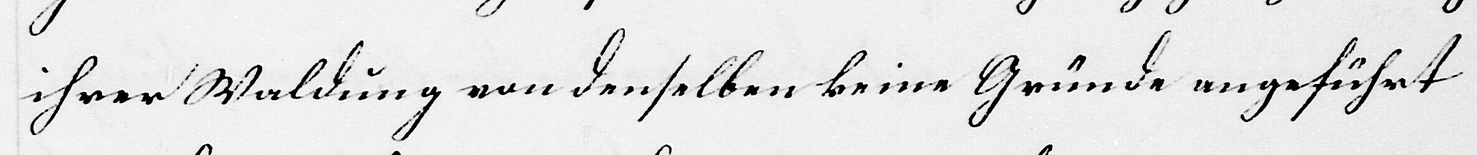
ihrer Waldung von denselben keine Gründe angeführt
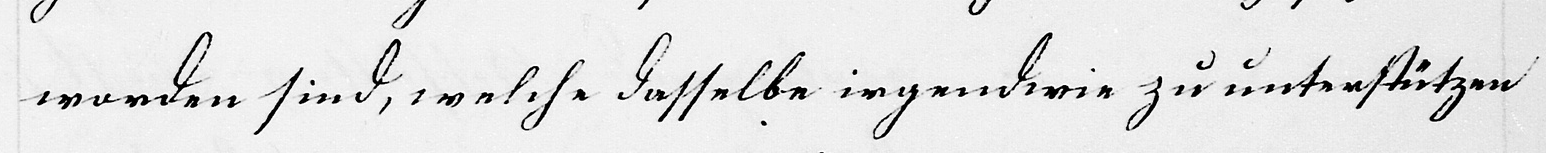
worden sind, welche dasselbe irgendwie zu unterstützen
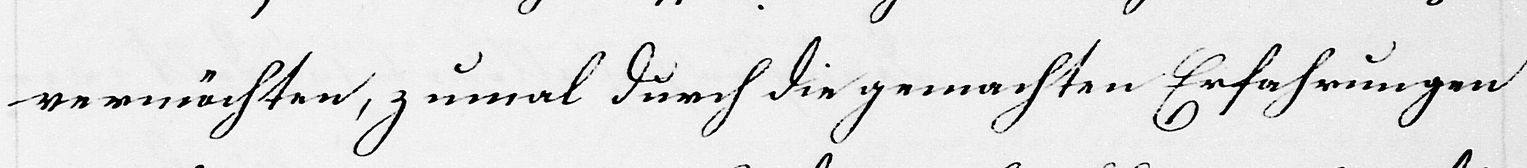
vermöchten, zumal durch die gemachten Erfahrungen
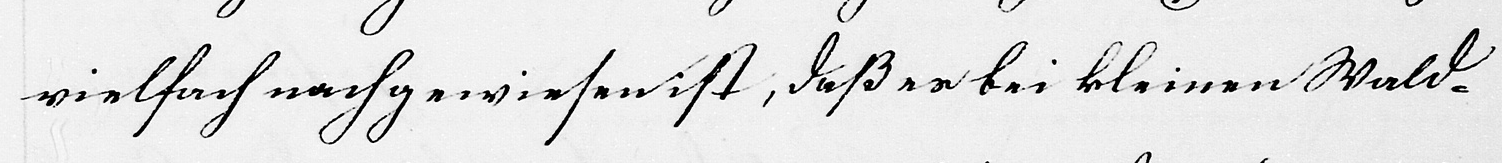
vielfach nachgewiesen ist, daß es bei kleinen Wald¬
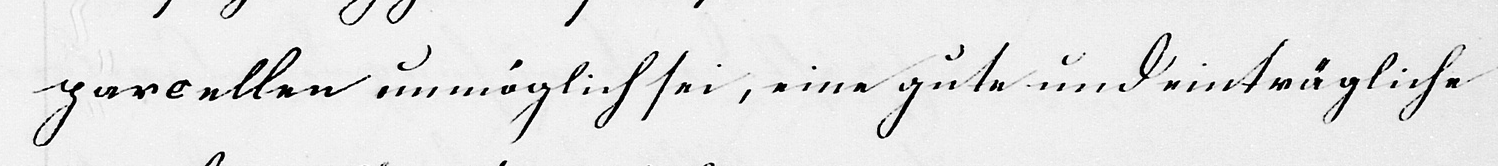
parcellen unmöglich sei, eine gute und einträgliche
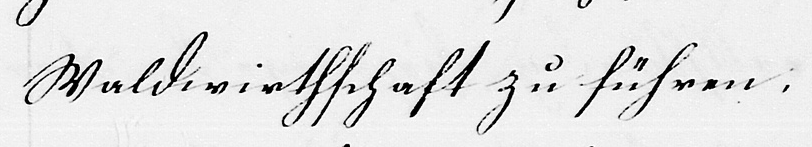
Waldwirthschaft zu führen;
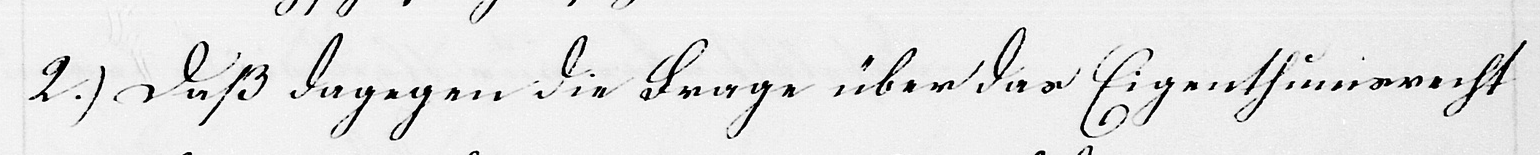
2.) Daß dagegen die Frage über das Eigenthumsrecht
